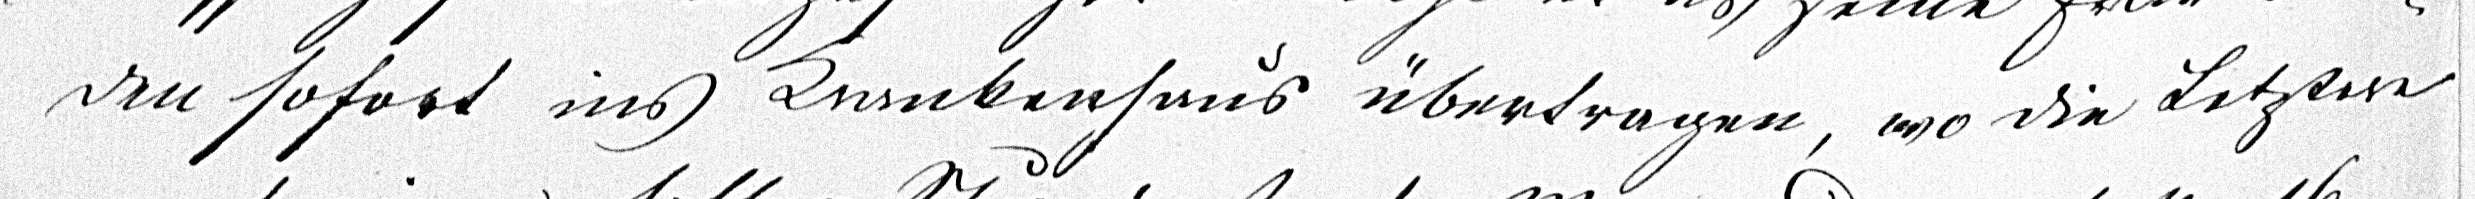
den sofort ins Krankenhaus übertragen, wo die Letzten
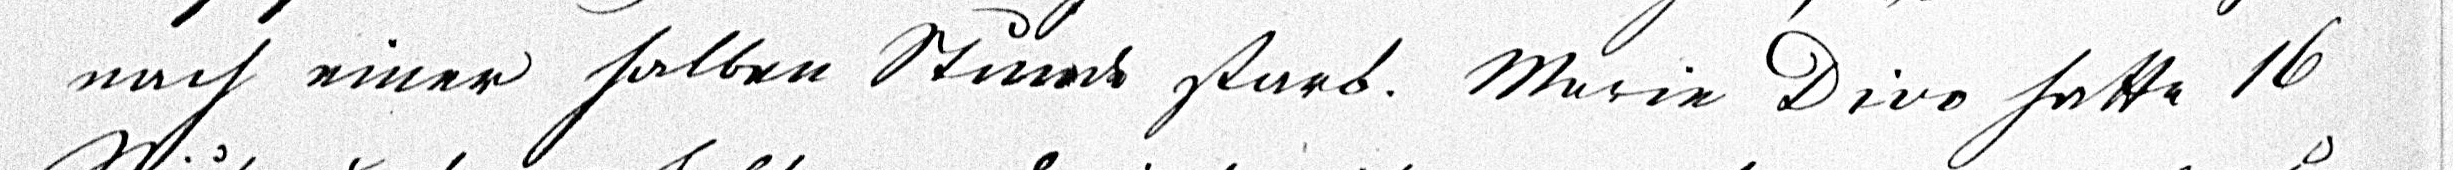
nach einer halben Stunde starb. Marie Divo hatte 16
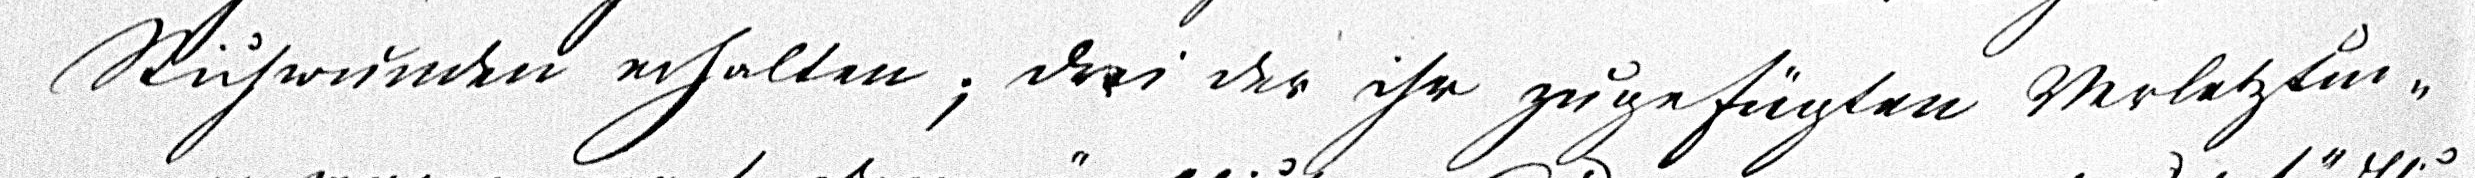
Richwunden erhalten; drei der ihr zugefügten Verletzun¬
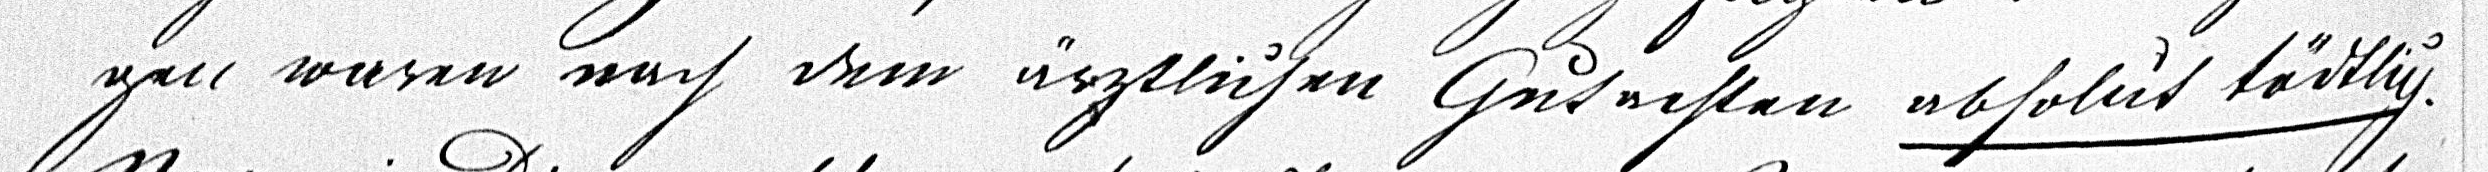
gen waren nach dem ärztlichen Gutachten absolut tödtlich.
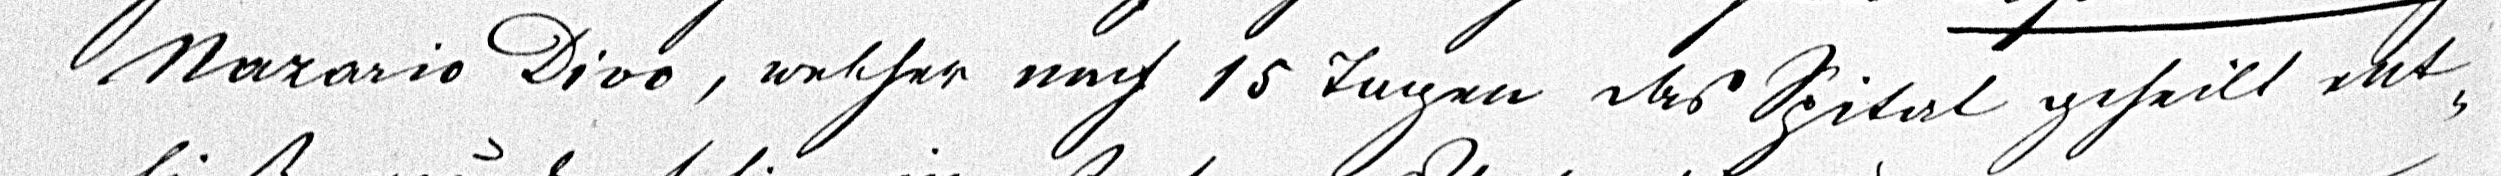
Nazario Divo, welcher nach 15 Tagen das Spital geheilt ent¬
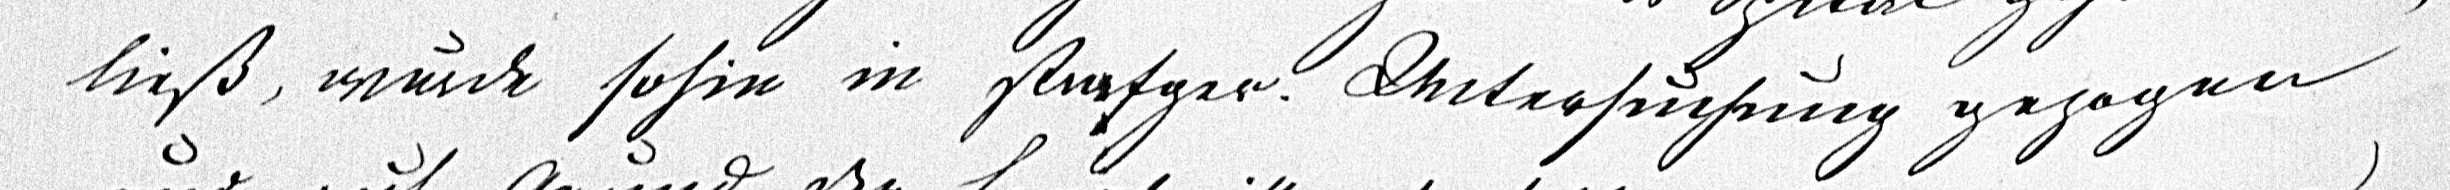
ließ, wurde sohin in strafger. Untersuchung gezogen
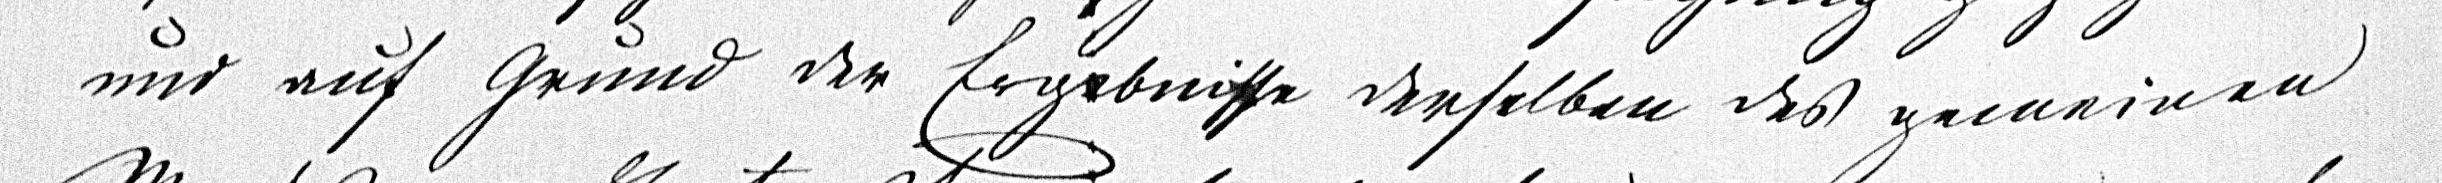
und auf Grund der Ergebnisse derselben des gemeinen
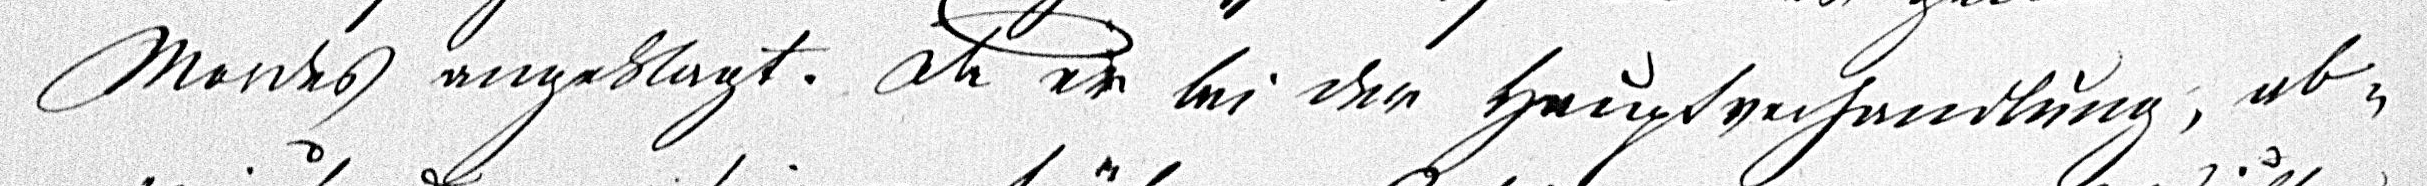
Mordes angeklagt. Da er bei der Hauptverhandlung; ab¬
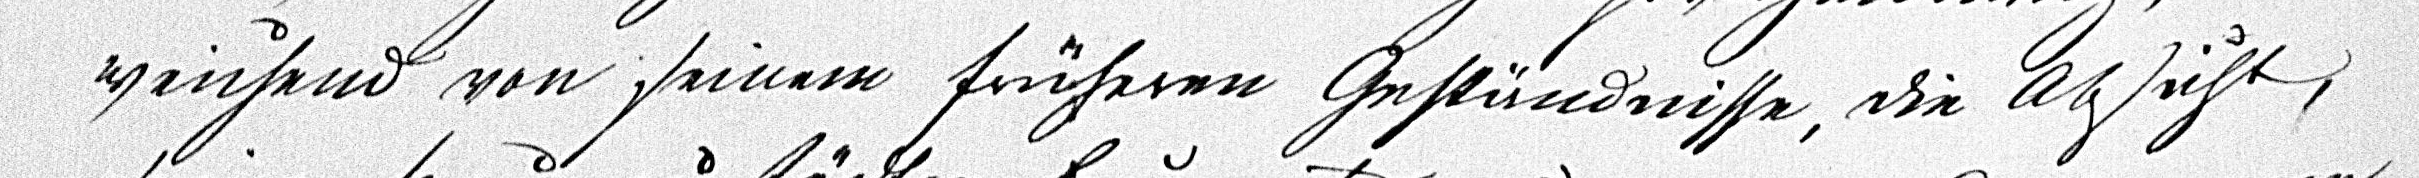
weichend von seinem früheren Geständnisse, die Absicht,
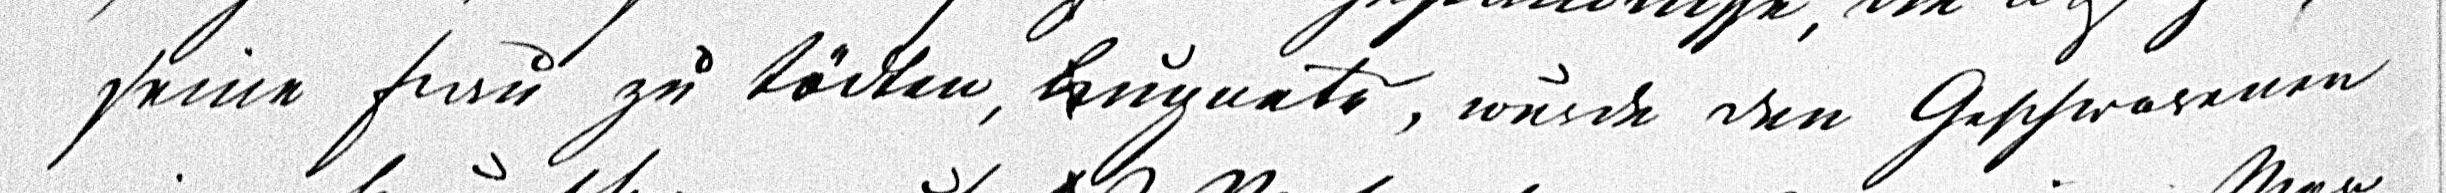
seine Frau zu tödten, leugnete, wurde den Geschworenen
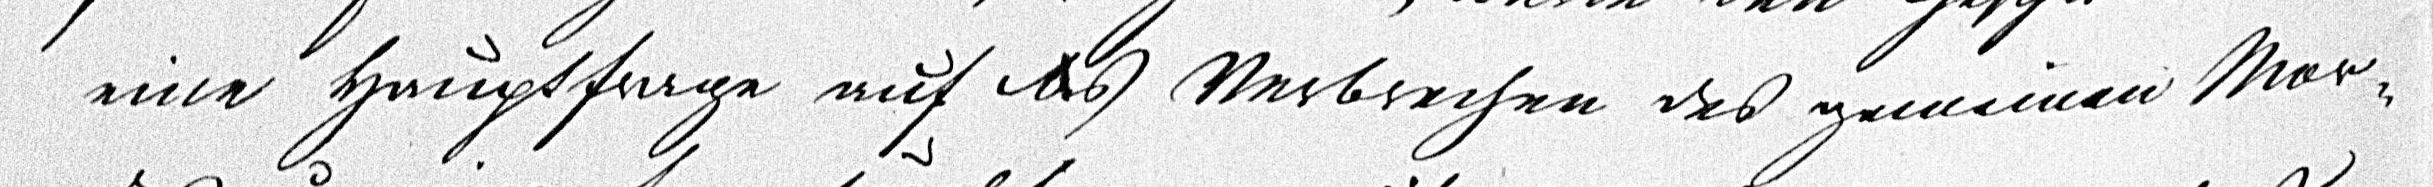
eine Hauptfrage auf das Verbrechen des gemeinen Mor¬
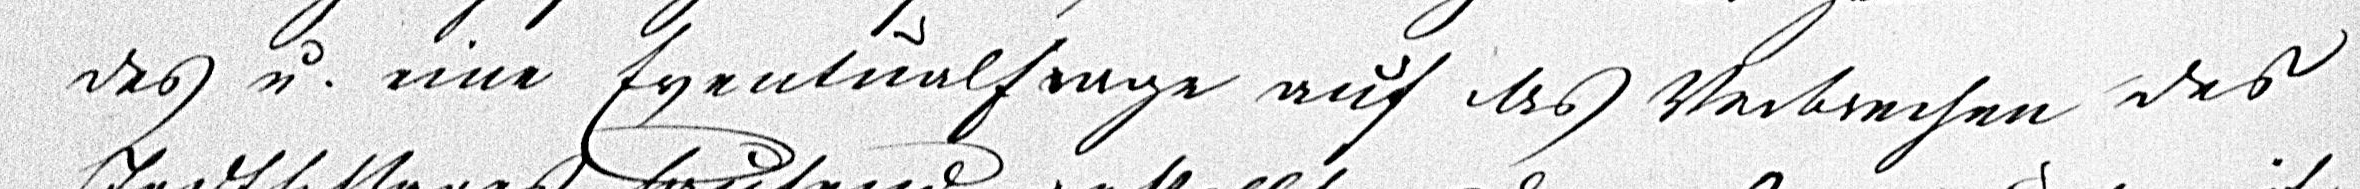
des u. eine Eventualfrage auf das Verbrechen des
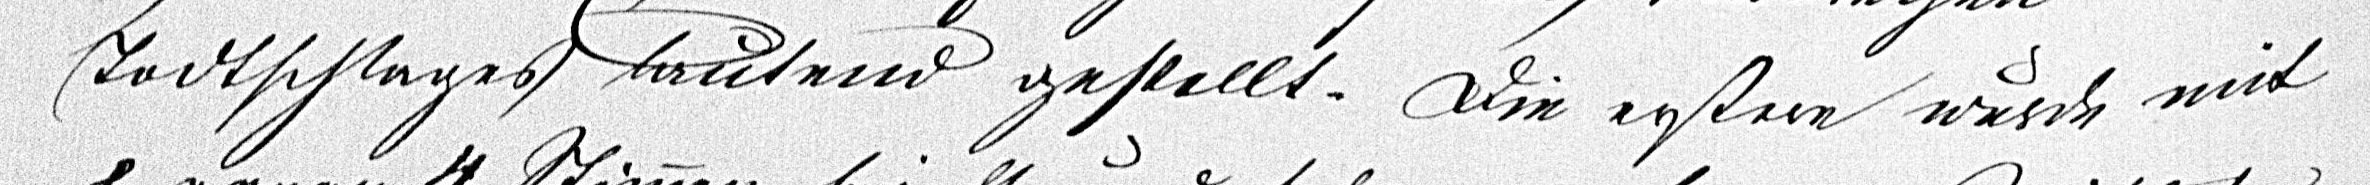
Todtschlages lautend gestellt. Die erstere wurde mit
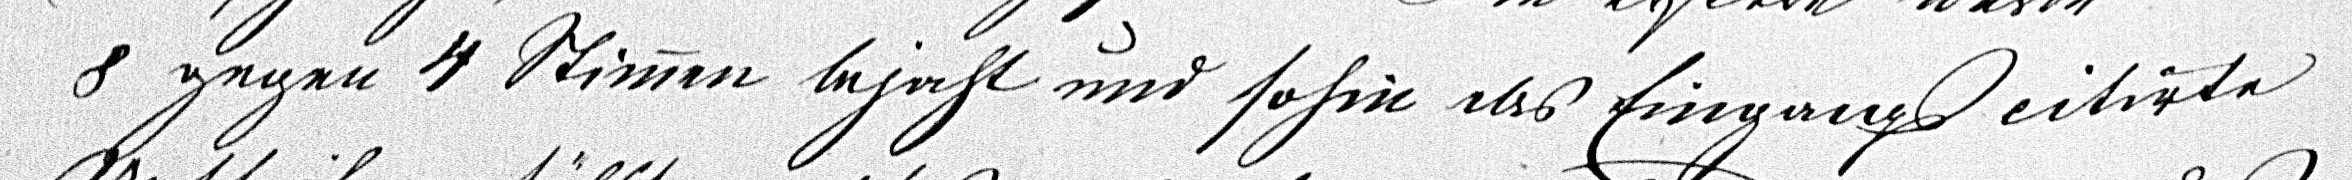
8 gegen 4 Stimmen bejaht und sohin das Eingangs citirte
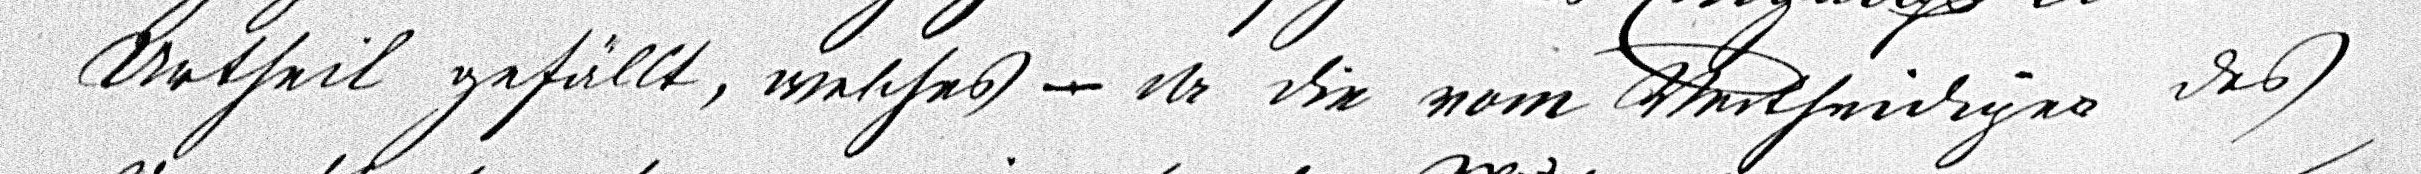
Urtheil gefällt, welches — xx die vom Verteidigen des
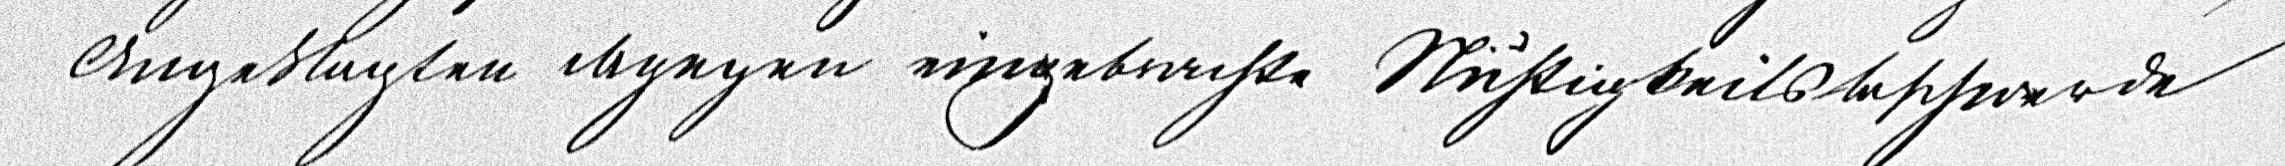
Angeklagten eingebrachte Nichtigkeitsbeschwerde
